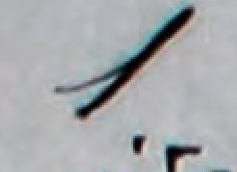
1
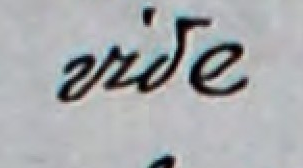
vide
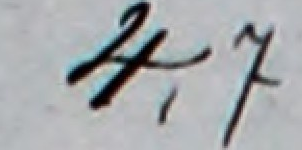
4, 7
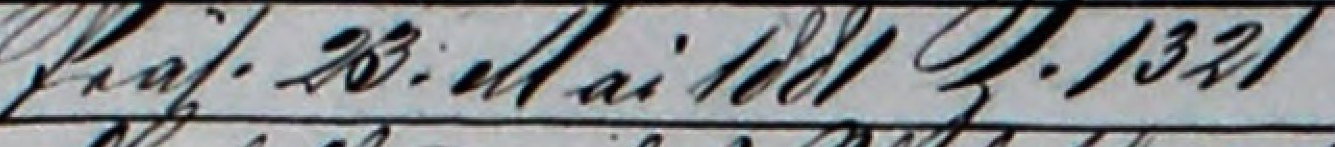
Präs. 23. Mai 1881 Z. 1321
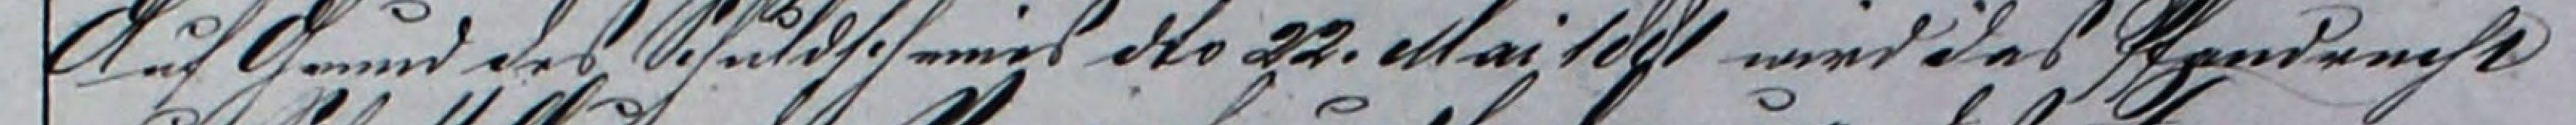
Auf Grund des Schuldscheines ddo 22. Mai 1881 wird das Pfandrecht
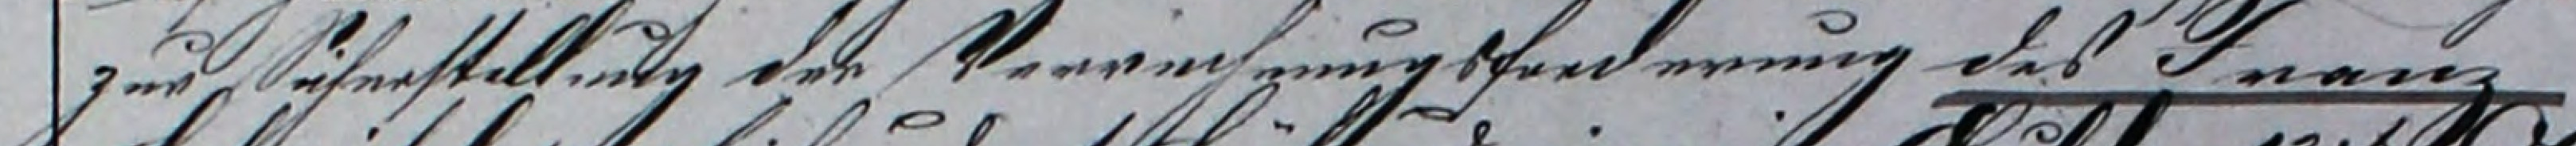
zur Sicherstellung der Verrechnungsforderung des Franz
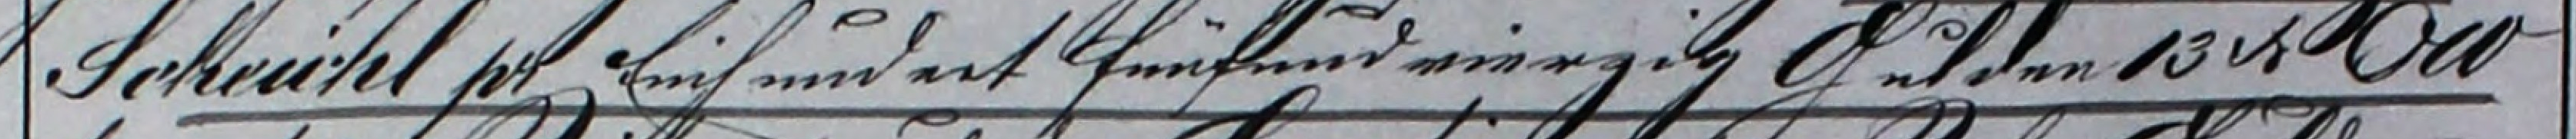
Scheichl pr Einhundert Fünfund vierzig Gulden 13 Fr OW
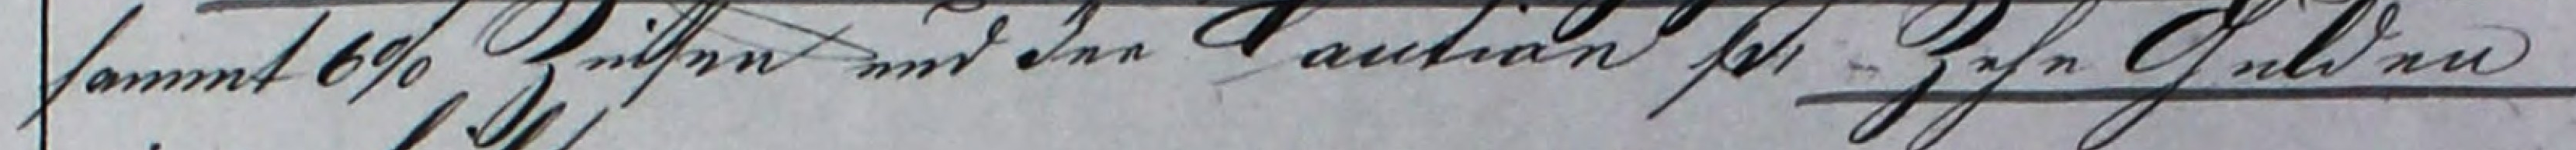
sammt 6% Zeisen und der Cautian pr Zehn Gulden
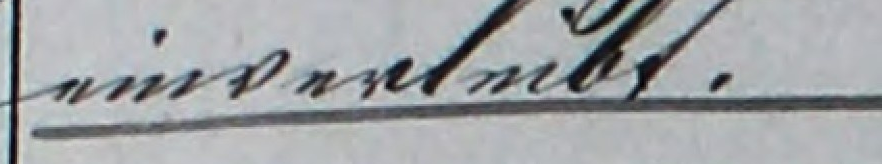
einverleibt.
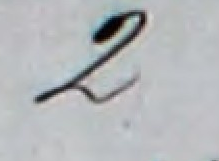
2
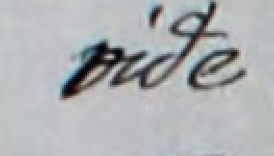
vide
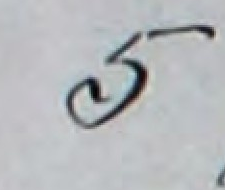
5
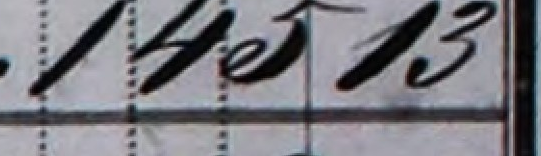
145 13
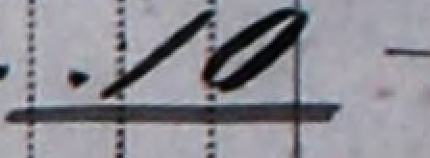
10
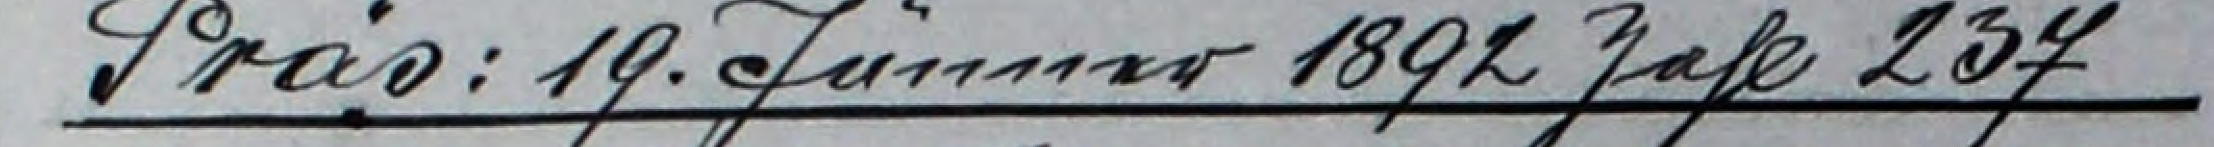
Präs: 19. Jänner 1892 Zahl 237
